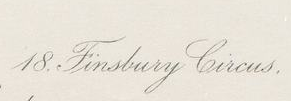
18. Finsbury Circus.
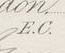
E. C.
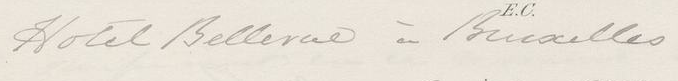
Hotel Bellevue à Bruxelles
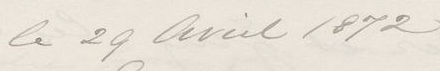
le 29 Avril 1872
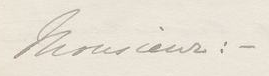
Monsieur: –
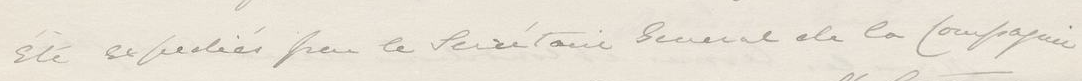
Eté expediés par le Secrétaire General de la Compagnie
